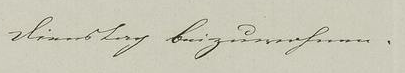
Dienstag beizuwohnen.
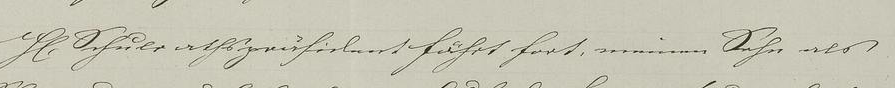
Herr Schulrathspräsident fährt fort, meinen Sohn als
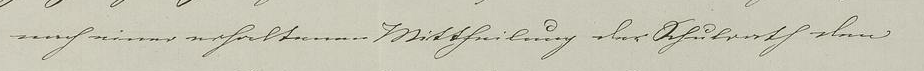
nach einer erhaltenen Mittheilung der Schulrath den
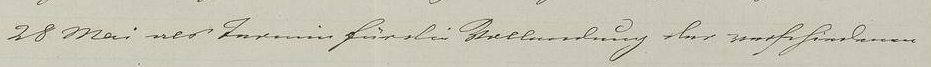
28 Mai als Termin für die Vollendung der verschiedenen
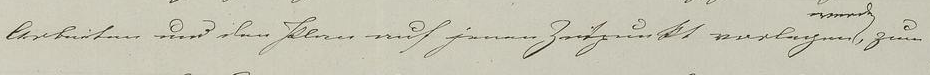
Arbeiten und den Plan auf jenen Zeitpunkt vorlegen werde, zum
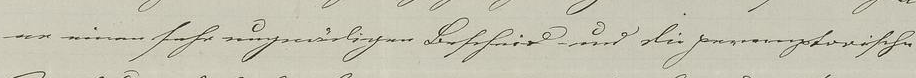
er einen sehr ungnädigen Bescheid und die peremptorische
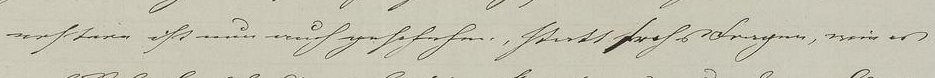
erstere ist nun auch geschehen, statt sechs Fragen, wie es
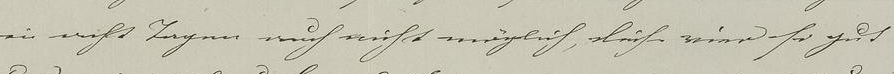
in acht Tagen auch nicht möglich, diese vier so gut
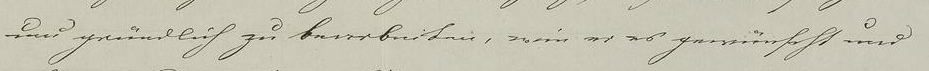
und gründlich zu bearbeiten, wie er es gewünscht und
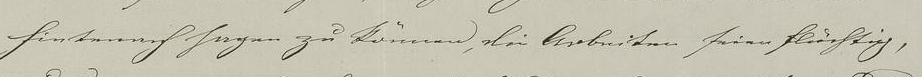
hintenach sagen zu können, die Arbeiten seien flüchtig,
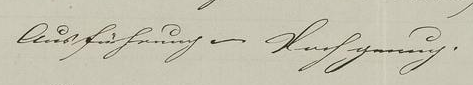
Ausführung. – Doch genug.
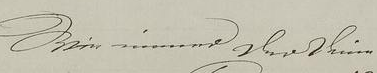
Wie immer der Deine
